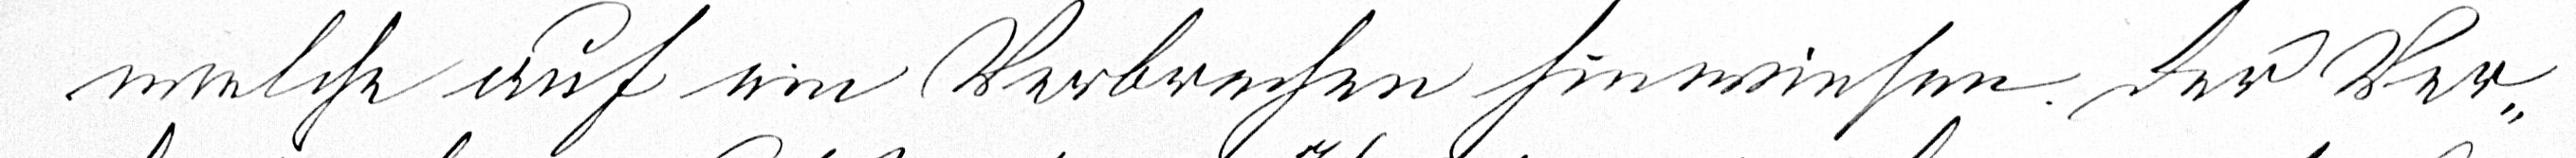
welche auf eine Verbrechen hinwiesen. Der Ver¬
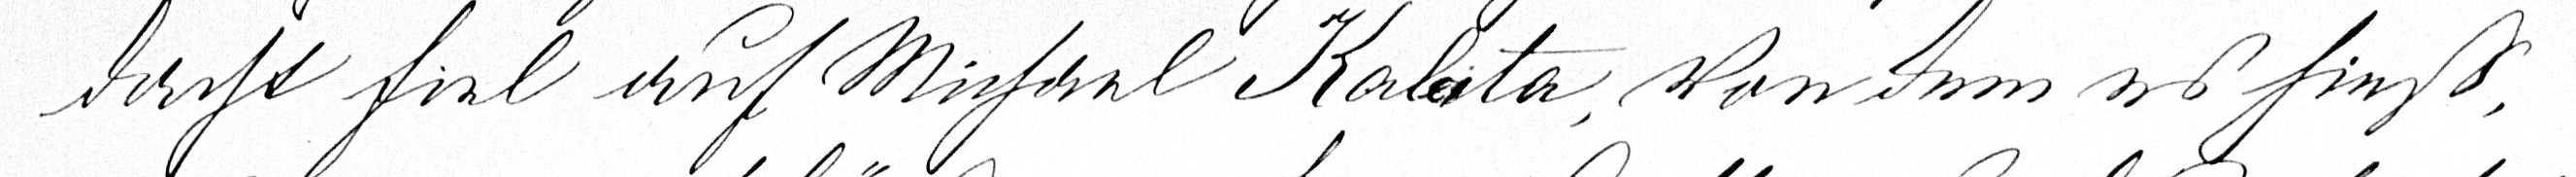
dacht fiel auf Michael Kalata, von dem es hieß,
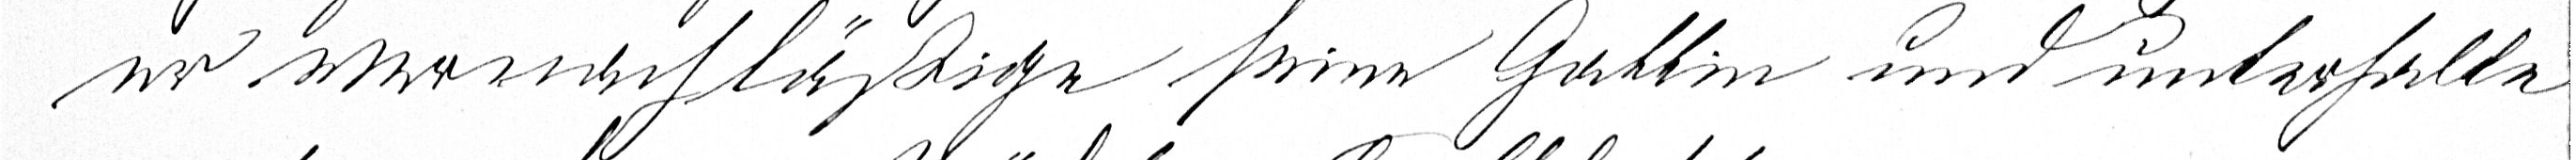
er vernachläßige seine Gattin und unterhalte
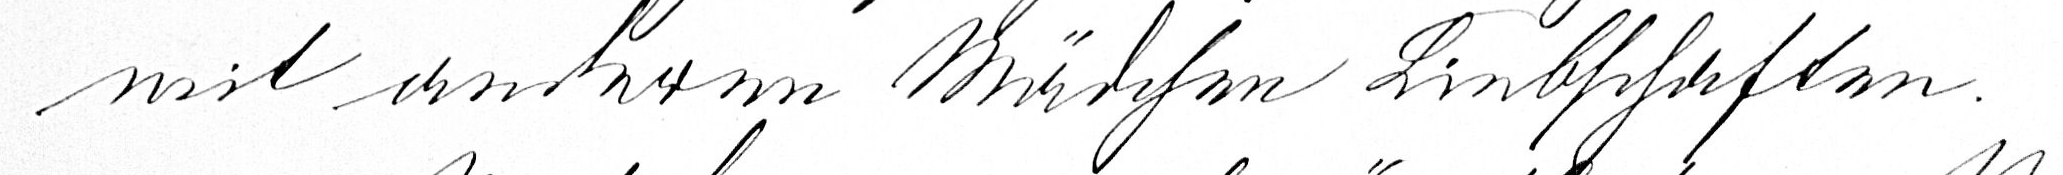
mit anderen Mädchen Liebschaften.
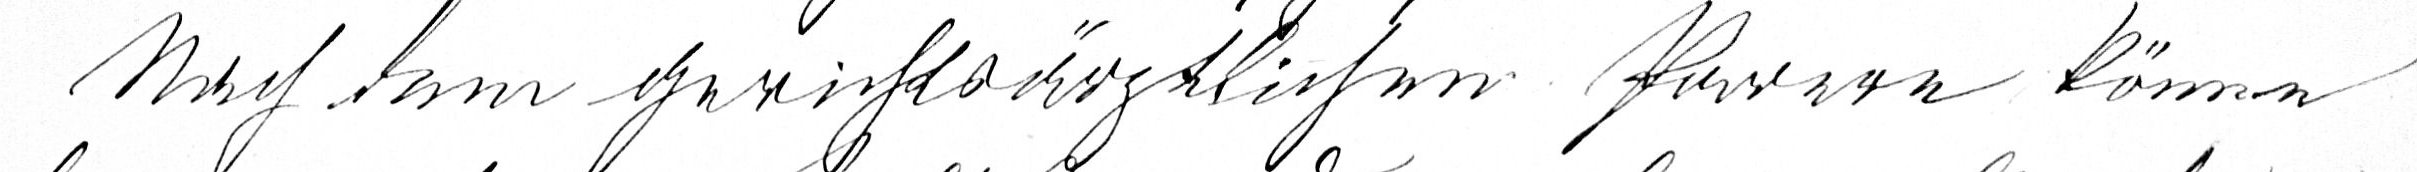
Nach dem gerichtsärztlichen Parere könne
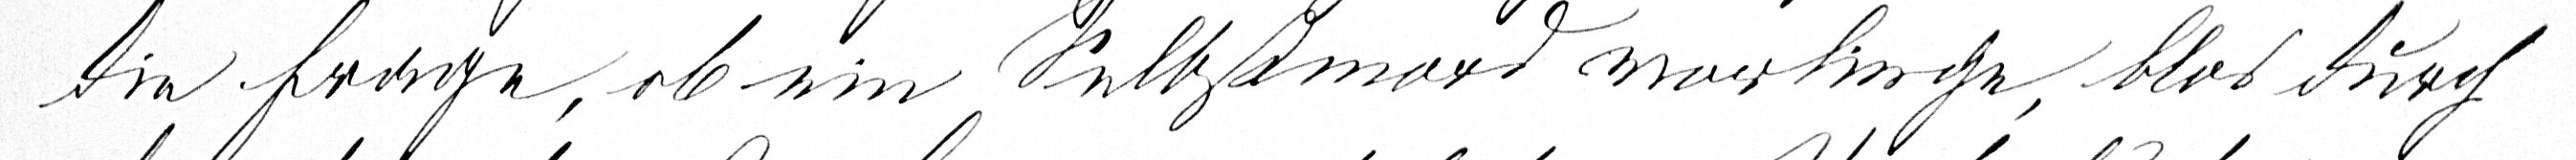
die Frage, ob ein Selbstmord vorliege, blos durch
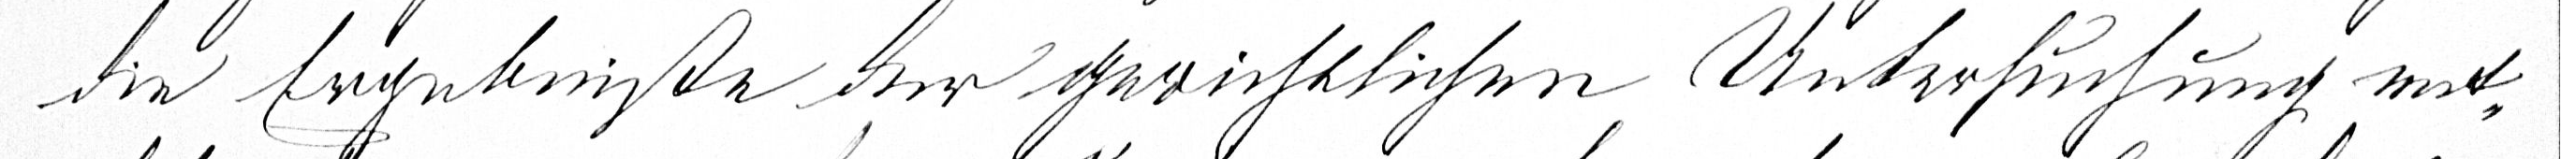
die Ergebniße der gerichtlichen Untersuchung ent¬
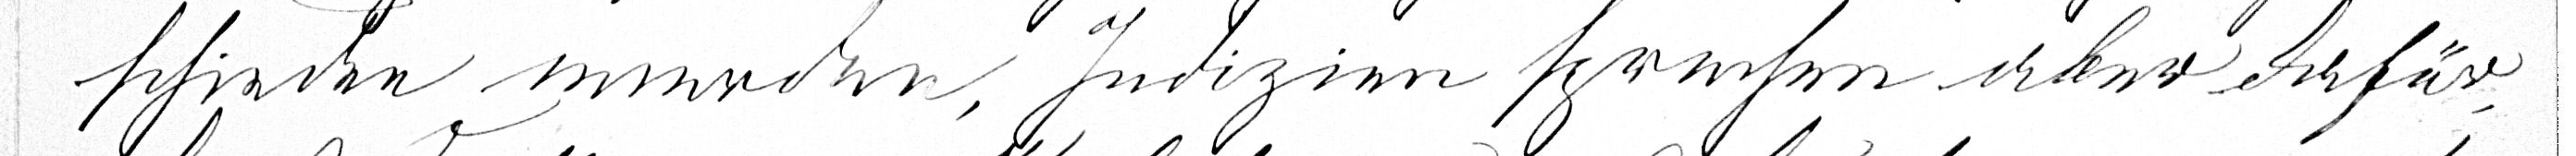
schieden werden, Indizien sprechen aber dafür,
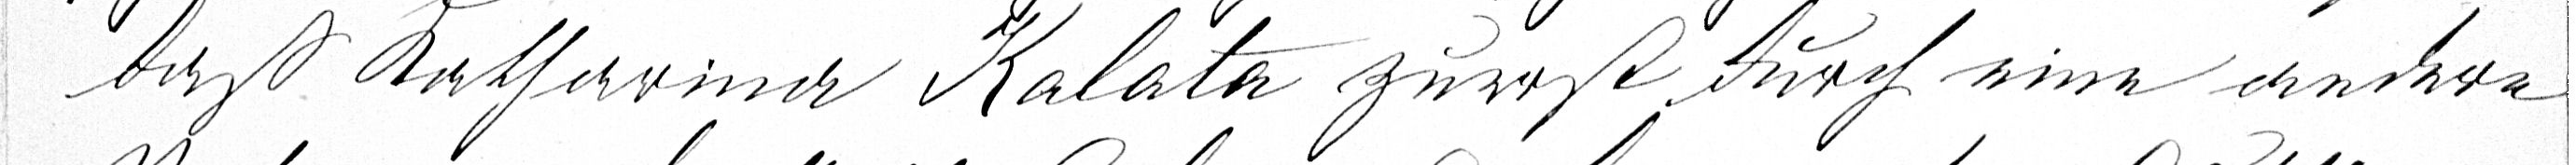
daß Katharina Kalata zuerst durch eine andere
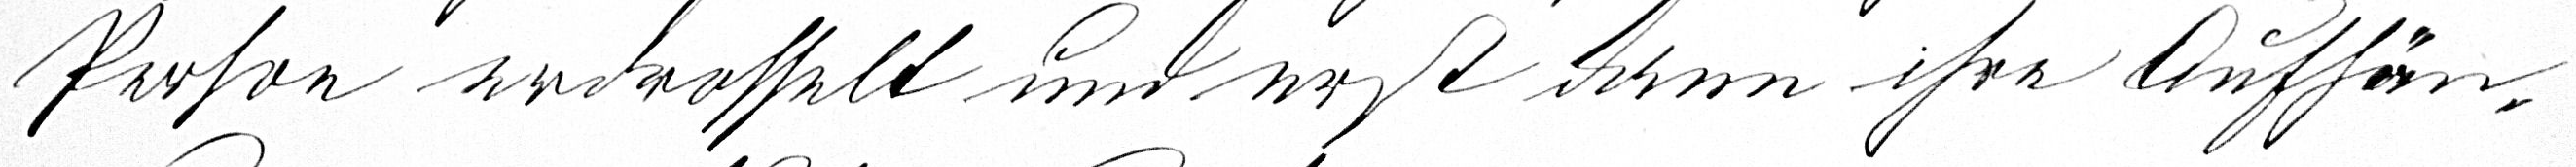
Person erdrosselt und erst dann ihre Aufhän¬
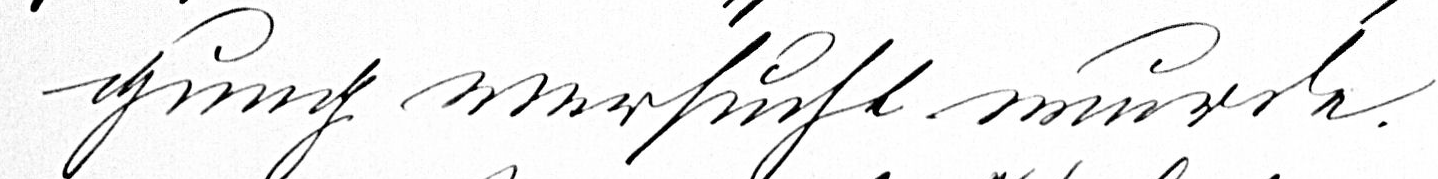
gung versucht wurde.
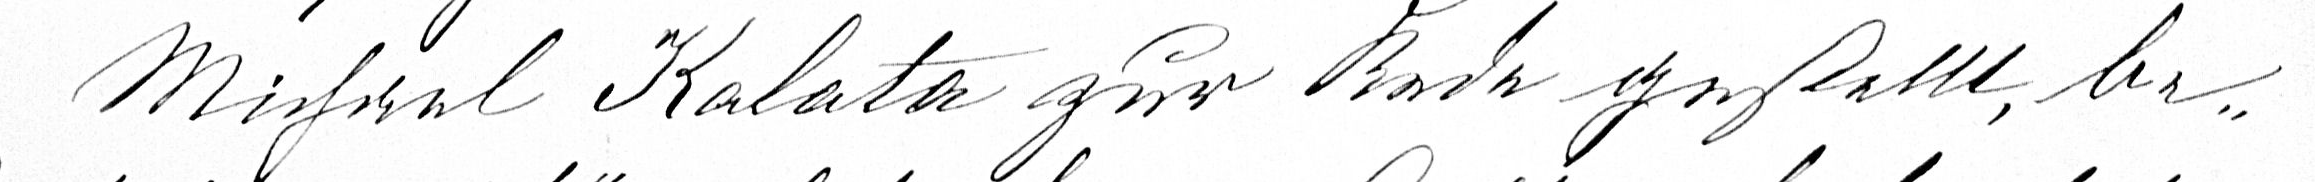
Michael Kalata zur Rede gestellt, be¬
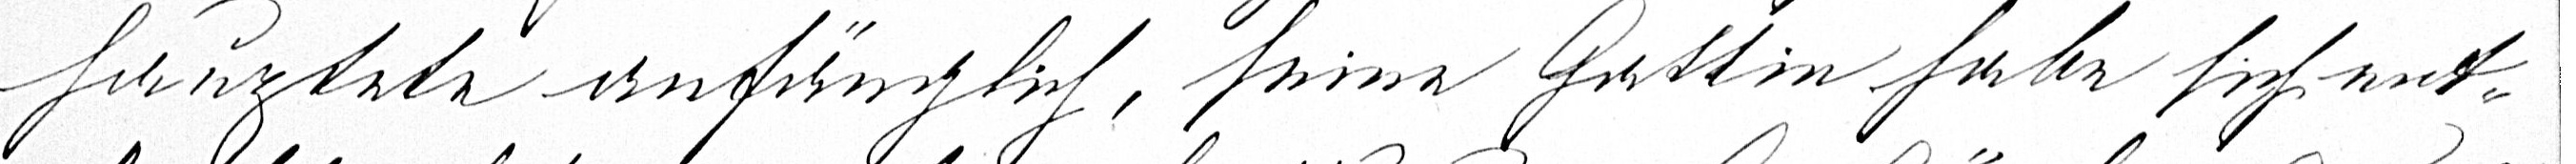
hauptete anfänglich, seine Gattin habe sich ent¬
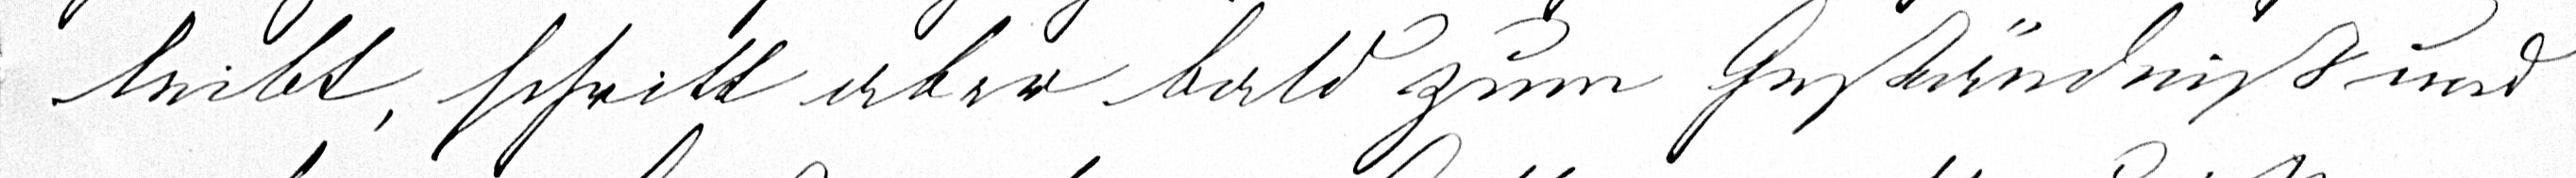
leibt, schritt aber bald zum Geständniß und
